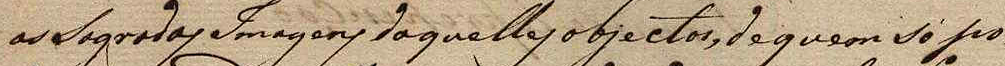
as Sagradas Imagens daquelles objectos, de que só po
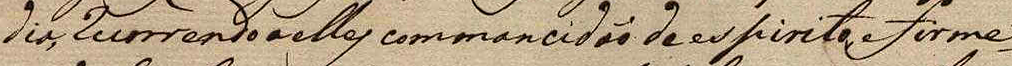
dia, Recorrendo a elles com mancidaõ de espirito e firme
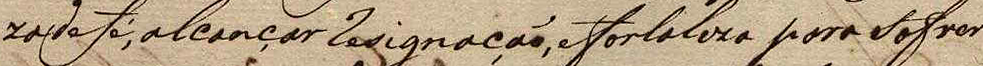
za de fé, alcançar Resignação, e fortaleza para sofrer
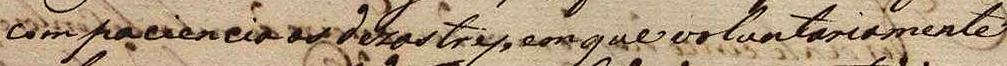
com paciencia os dezastres, em que voluntariamente
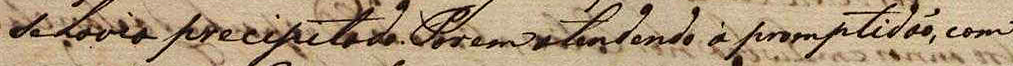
se havia precipitado. Porem atendendo á promptidaõ, com
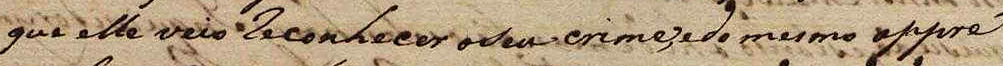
que elle veio Reconhecer o seu crime, e do mesmo appre
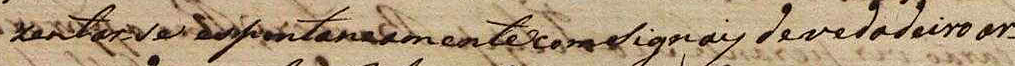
zentar-se espontaneamente com signais de verdadeiro ar
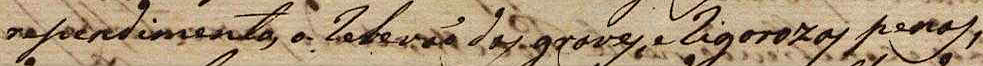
rependimento, o Relevaõ das graves, e Rigorozas penas,
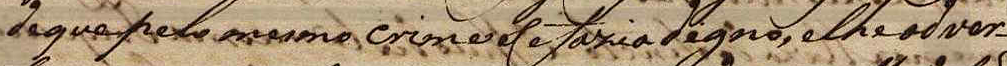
de que pelo mesmo crime se fazia digno, e lhe adver
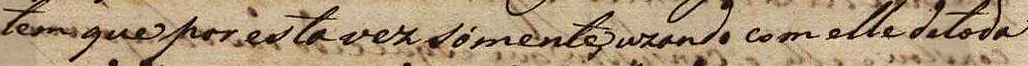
tem que por esta vez sómente, uzando com elle de toda
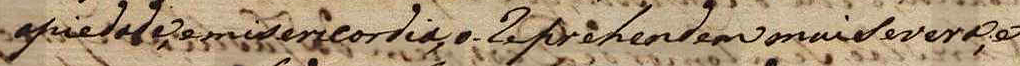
a piedade, e misericordia, o Reprehendem o mai severa, e
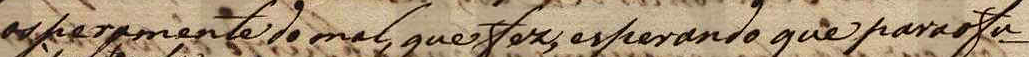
asperamente do mal, que fez, esperando que para o fu
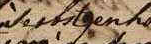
se abstenha
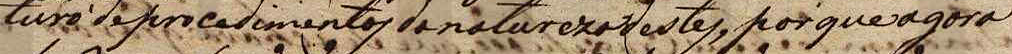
turo do procedimentos da natureza destes, porque agora
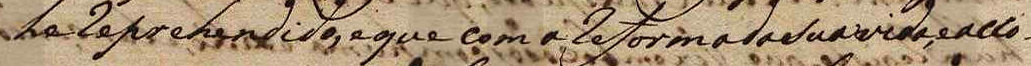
he Reprehendido, e que com a Reforma da sua vida, e acco
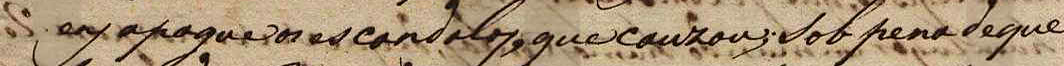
ens apague os escandalos, que cauzou, sob pena de que
